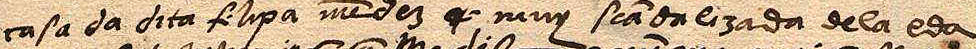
casa da dita filipa m̄edez _ muy scādalizada dela e da
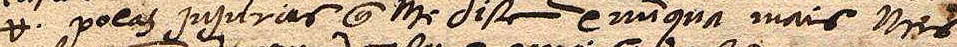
R. polas Jnjurias q̄ lhe dise e nūqua mais lhes
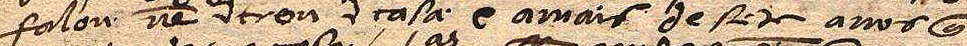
falou n̄e ētrou ē casa e a mais de sete anos q̄
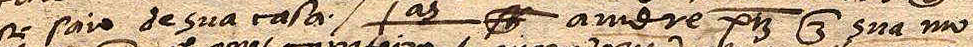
se saio de sua casa / tas st amdre p̄iz item sua mo
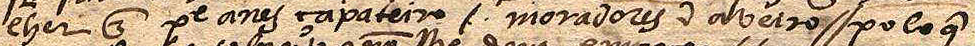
lher item pe anes çapateiro / moradores ē aveiro // polo q̄
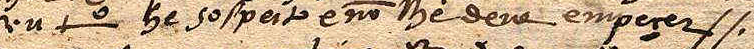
seu to he sospeito e n̄o lhe deue empeçer //.
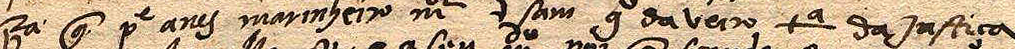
Pra q̄ pe anes marinheiro mor ē sam go daveiro ta da Justiça
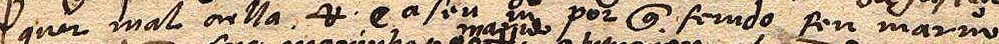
quer maL a ella R e a seu mdo porq̄ semdo seu marno
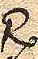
Rꝭ
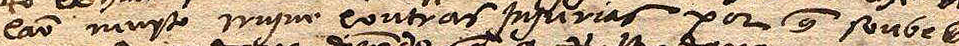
laõ muyto rrujm e outras Jnjurias porq̄ soube q̄
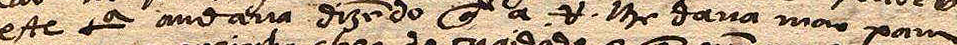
este ta andaua dizēdo q̄ a R lhe daua mao pam
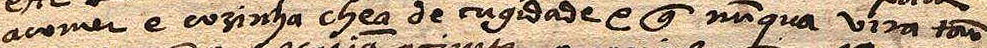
a comer e cozinha chea de cugidade e q̄ nūqua vira tão
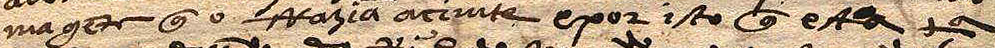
ma gēte q̄ o ffaziā açimte e por isto q̄ esta ta
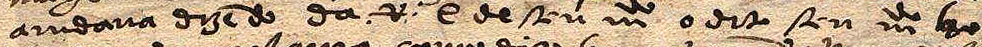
amdaua dizēdo da R e de seu mdo o dito seu mdo ho
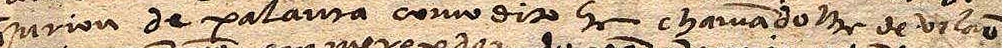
ījuriou de palaura como dito he chamādo lhe de vilaõ
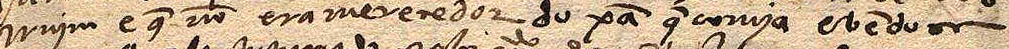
rrujm e q̄ n̄o era merecedor do pā q̄ comja e vēdo se
